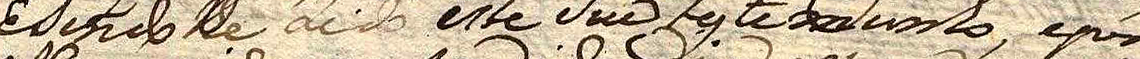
E Sendolhe Lido este seu testemunho, e por
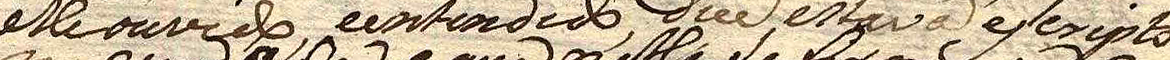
elle ouvido, e entendido, dice estava escripto
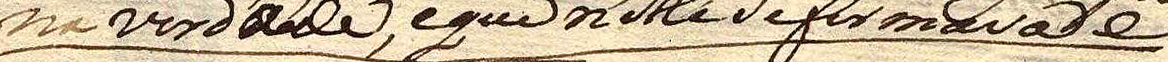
na verdade, e que nelle se fermava e
